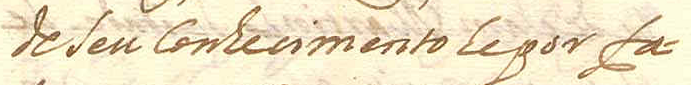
de seu conhecimento he por fa
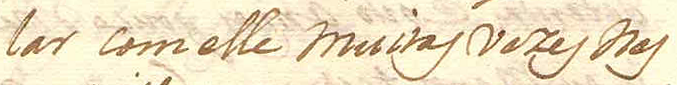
lar com elle muitas vezes nes
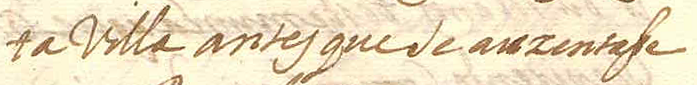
ta Villa antes que se auzentase
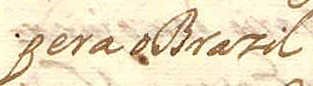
pera o Brazil
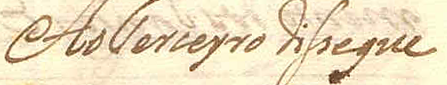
Ao Terceyro disse que
